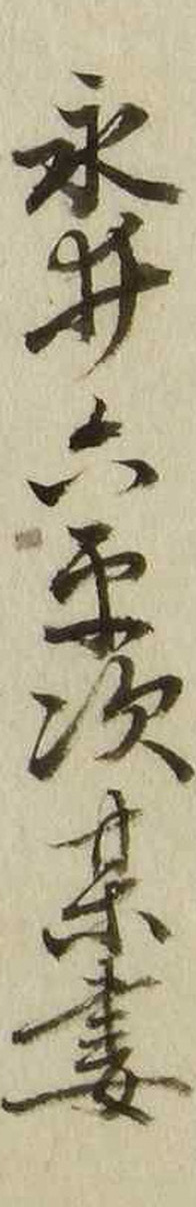女永井六平次某妻
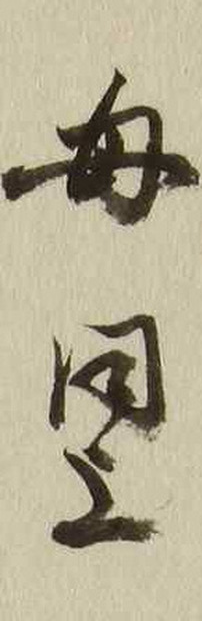母同上
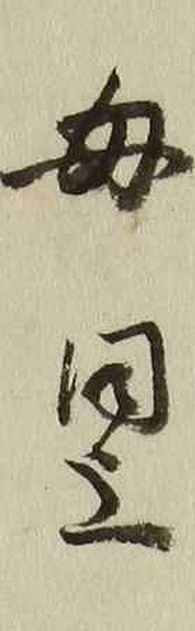母同上
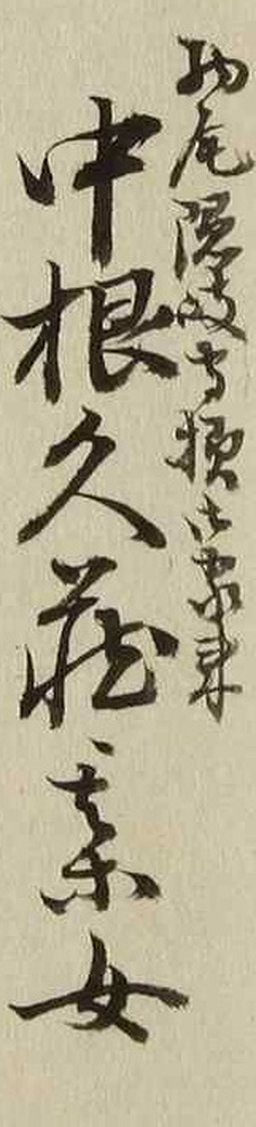妻中根久蔵某女
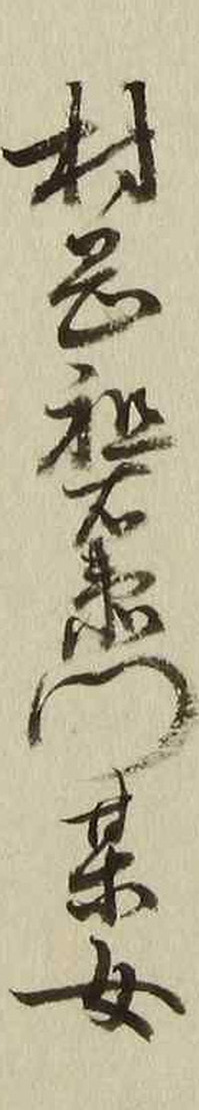村岡祖右衛門某女
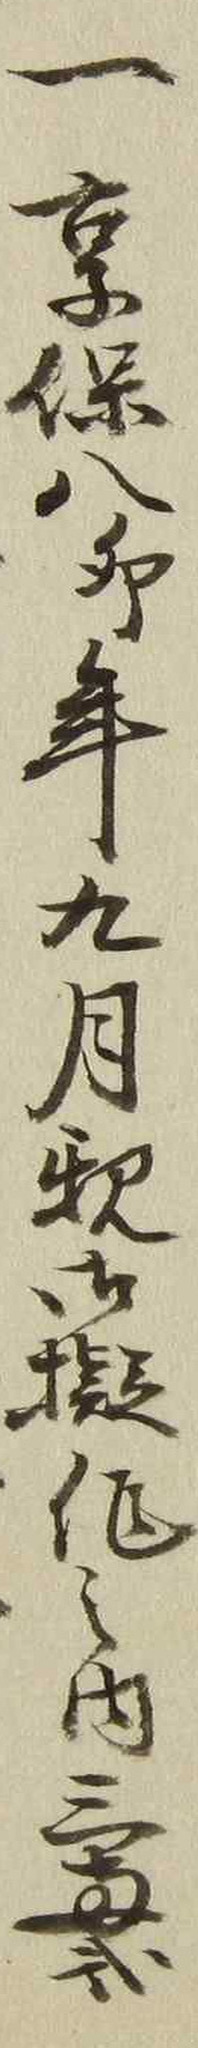一享保八卯年九月親御擬作之内三両弐
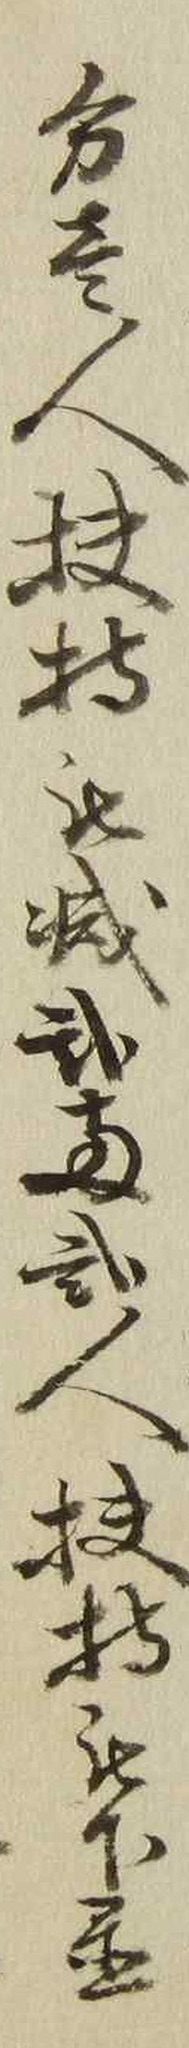分壱人扶持被減弐両弐人扶持被下置
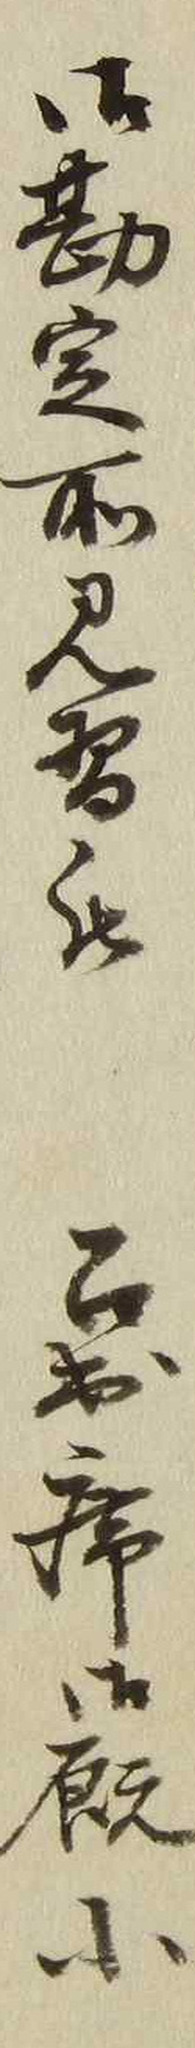御勘定所見習被召出席御厩小
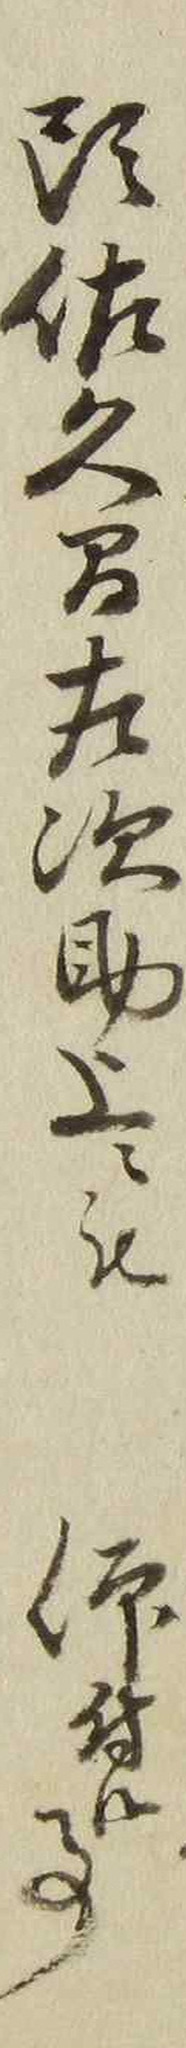頭佐久間左次助上ニ被仰付候事
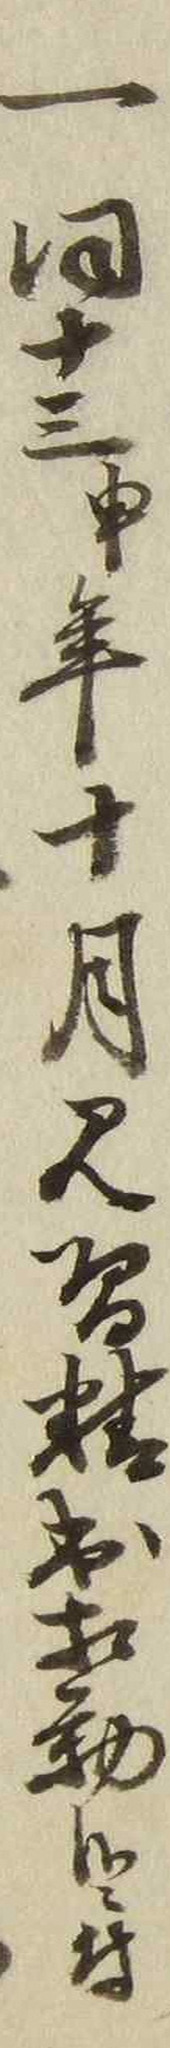一同十三申年十月見習精出相勤候ニ付
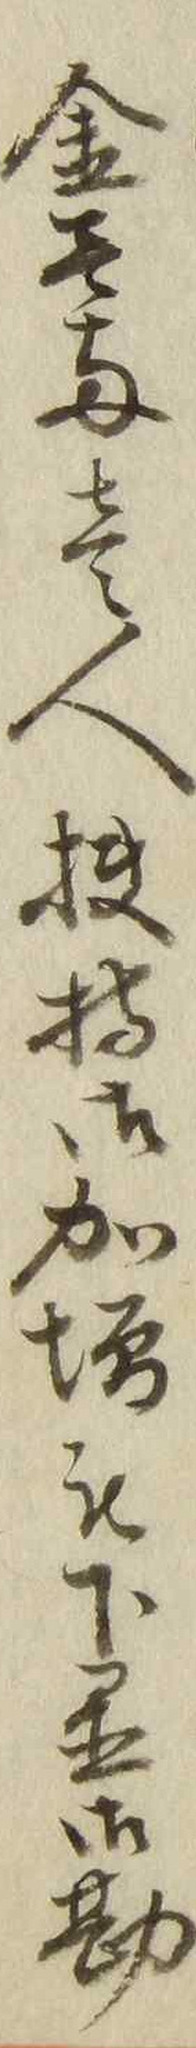金壱両壱人扶持御加増被下置御勘

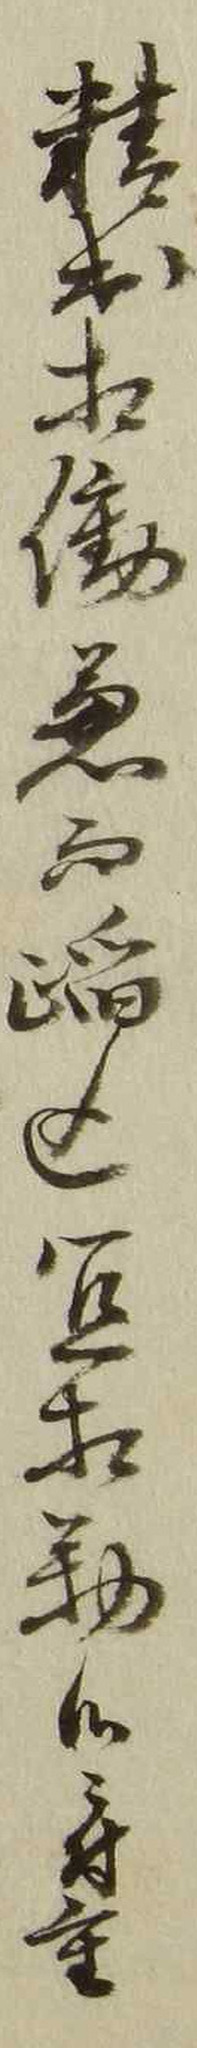精出相働兼而踏込宜相勤候ニ付重
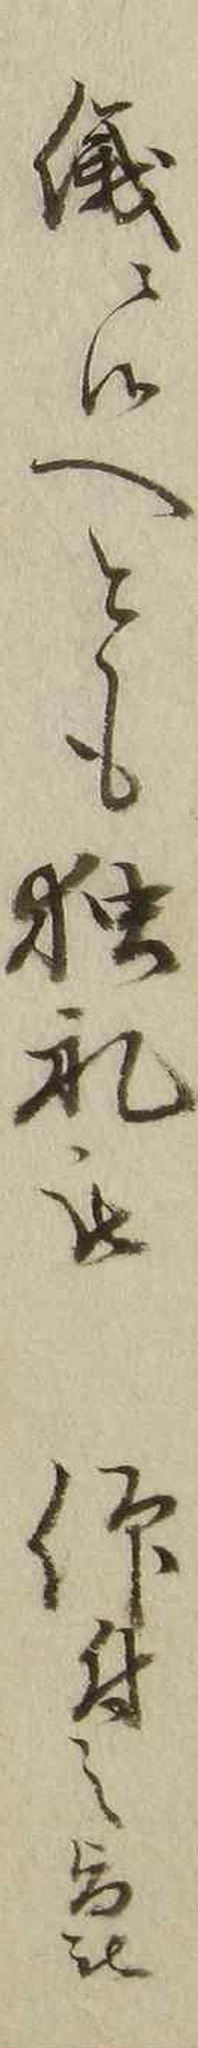儀ニ候へとも独礼被仰付之旨被
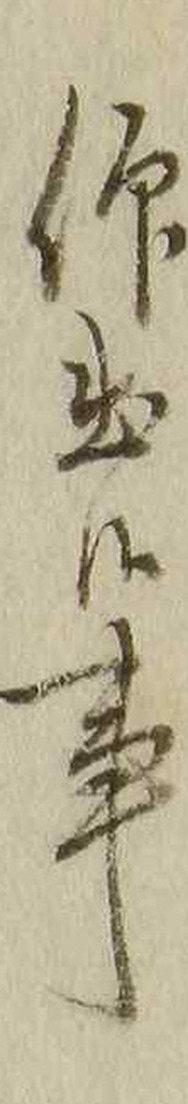仰出候事
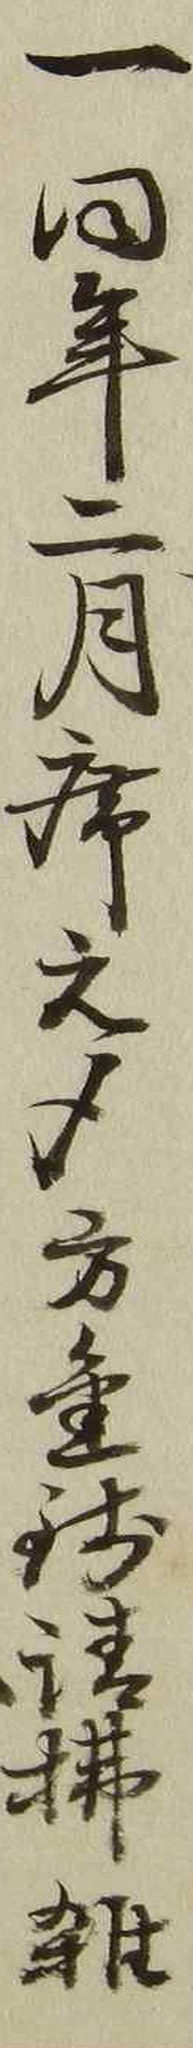一同年二月席元〆方金銭請払雑
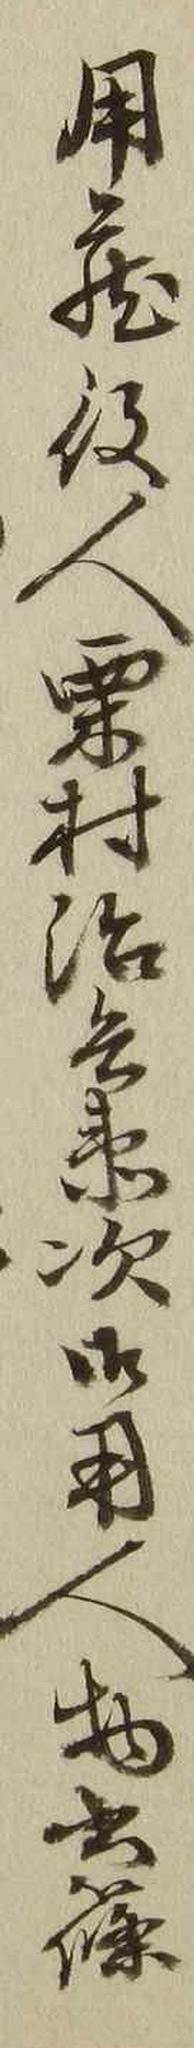用蔵役人栗村治兵衛次御用人物書篠
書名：諸士系譜　巻之53　に之部4
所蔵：会津若松市立会津図書館
